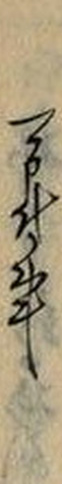可申付事
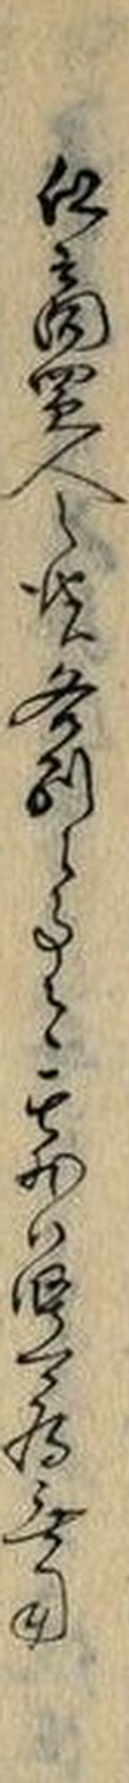但商買人之儀ハ各別之事ニ候其外ハ堅可為無用
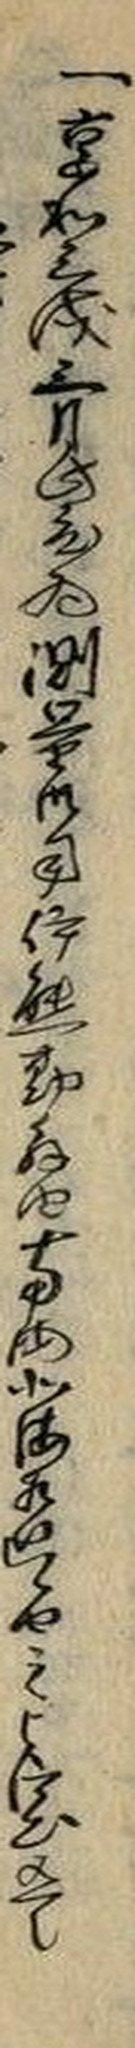一享和三戌三月此度為測量御用伊熊勘解由南海北海相廻候由之被仰出有之
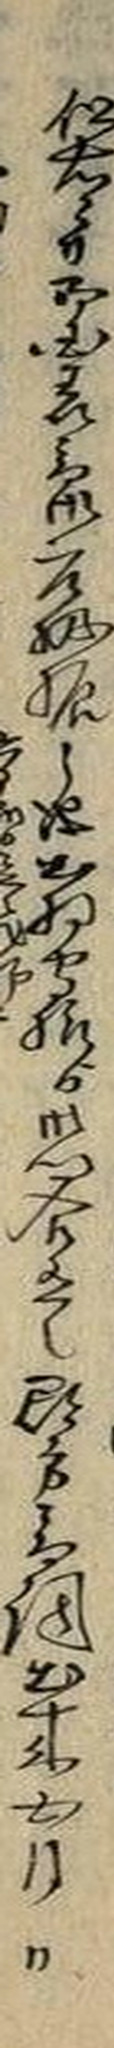但右ニ付御国表ニ而御取扱振之儀出羽守様ゟ御問合有之郡方ニ而調出来五月日
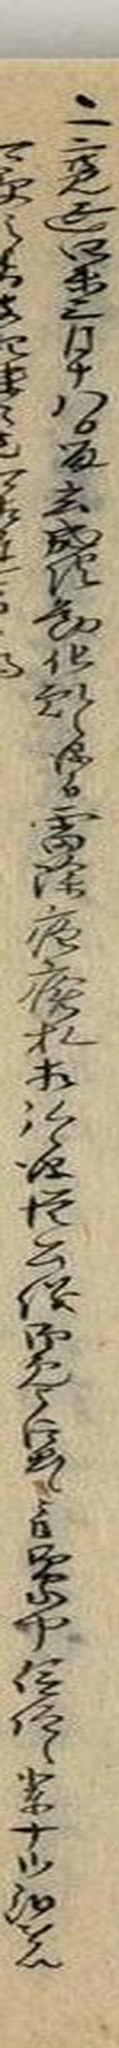・一寛延四未三月十八日留玄成院勧化願之儀ニ付雷除疱瘡札相弘候儀従公儀御免被仰出候ニ付御家中信仰之輩十弐を以
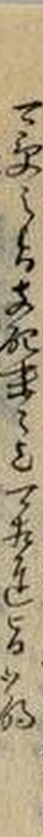可受之旨支配末々迄可相達旨御触
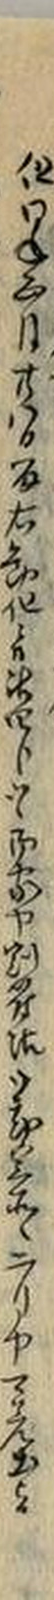但同年正月廿八日留右勧化ニ付銀四分ツヽ御家中割符銀御勘定所へ二月中可差出旨
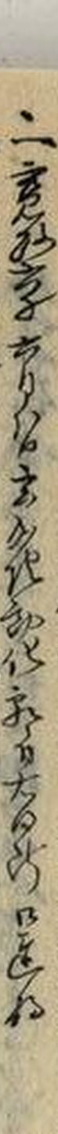・一寛政六寅六月八日玄成院勧化願ニ付右同断口達触
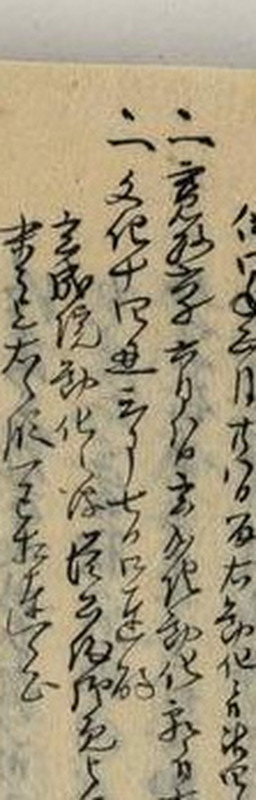・一文化十四丑三月七日口達触
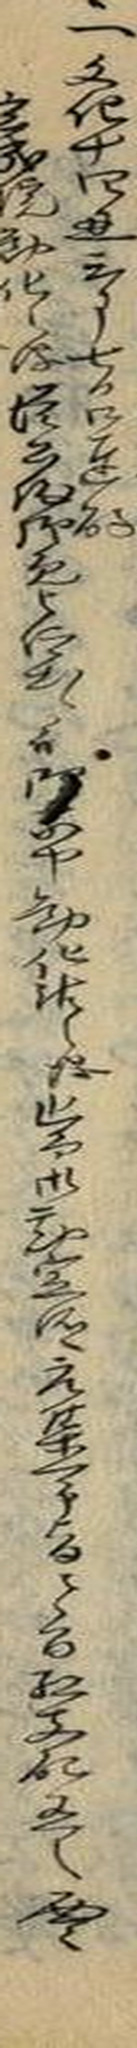玄成院勧化之儀従公儀御免被仰出候ニ付御家中勧化銀之儀追而御勘定所へ取集可申旨ニ候間組支配有之面々
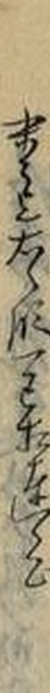末々迄右之段可被相達候以上
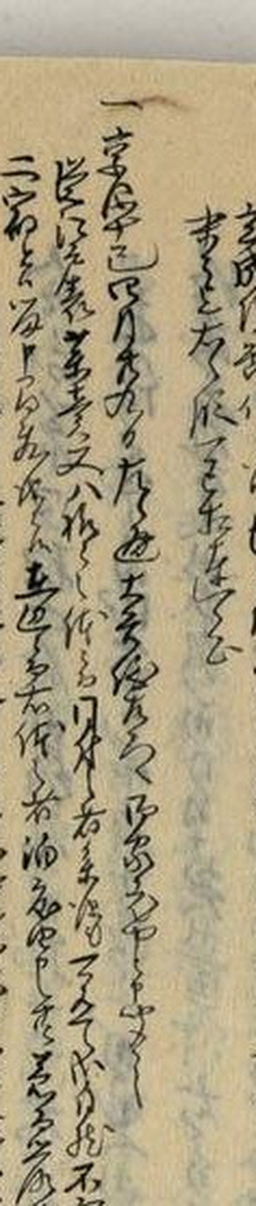一享保十巳四月廿九日左之通大谷儀左衛門へ御家老中被申聞之候
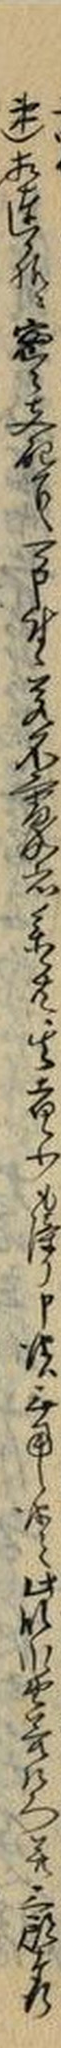速相達候様ニ密々支配下へ可申付候若不審成者参候共其者へ少も障り申儀ハ無用之儀ニ候此段水野善左衛門幷三郡奉行
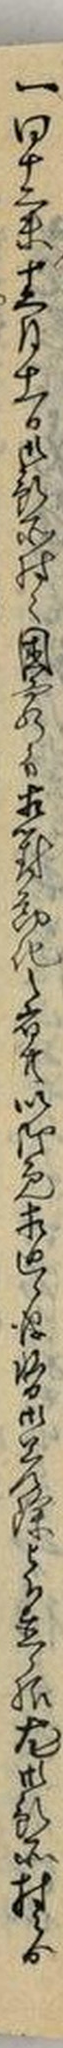一同十二未十二月十一日御預所村々困窮ニ付相対勧化之者共以御免相廻候儀暫御差除被下置候様尤御預所村々ゟ
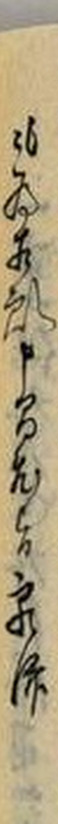も為相願申間敷旨願済
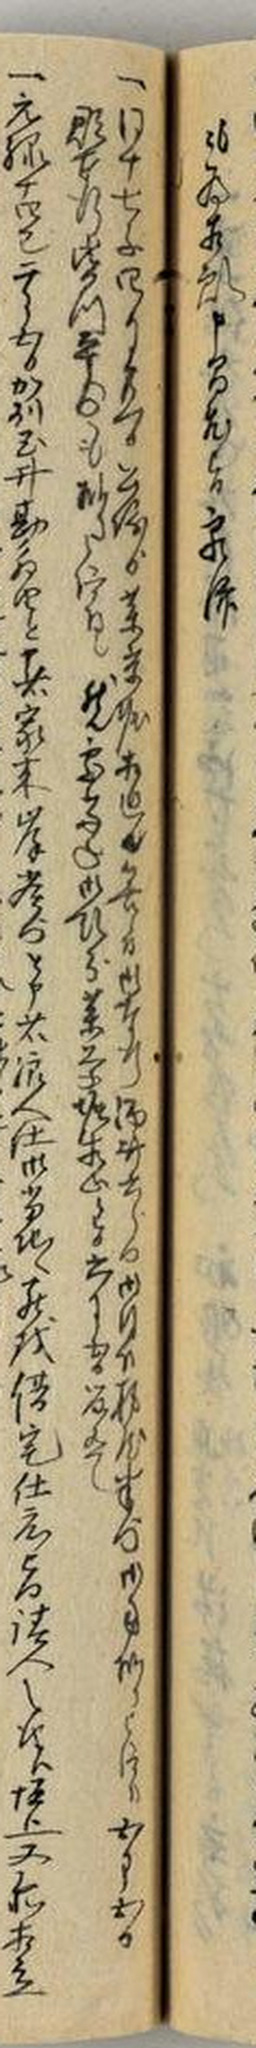一同十七子四月廿一日公儀ゟ薬草堀相廻ル筈ニ付御奉行酒井六右衛門御目付栃屋半右衛門御用掛り被仰付五月五日
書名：御国他国諸事之部
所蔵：福井県文書館 Fukui Prefectural Archives
